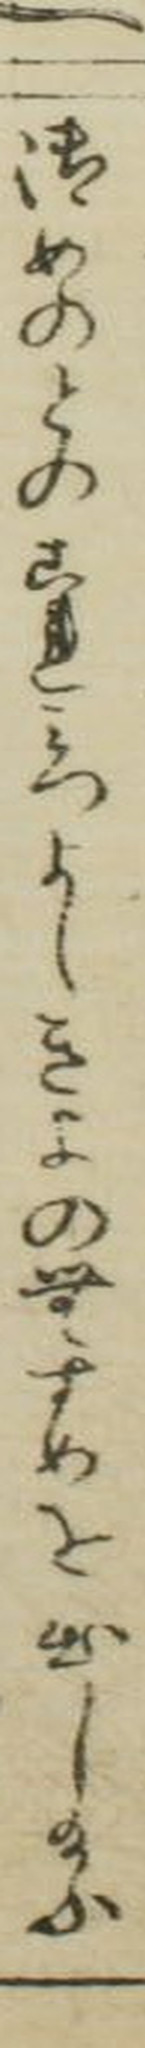御めのとのこれみつよしきよのむすめを出し給ふ
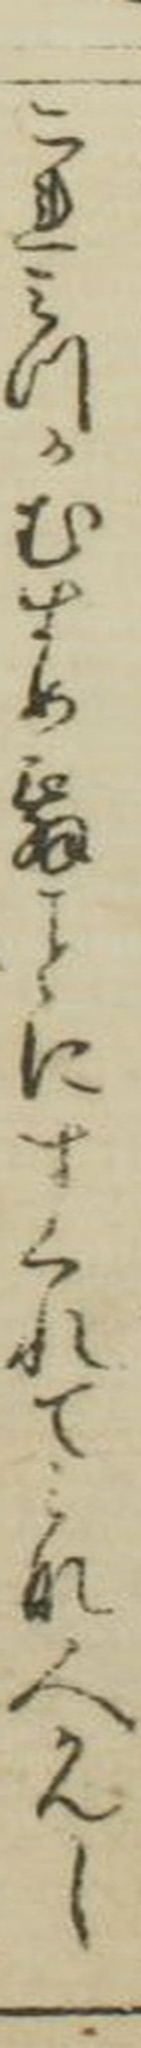これみつかむすめ舞ことにすくれてみな人かんし
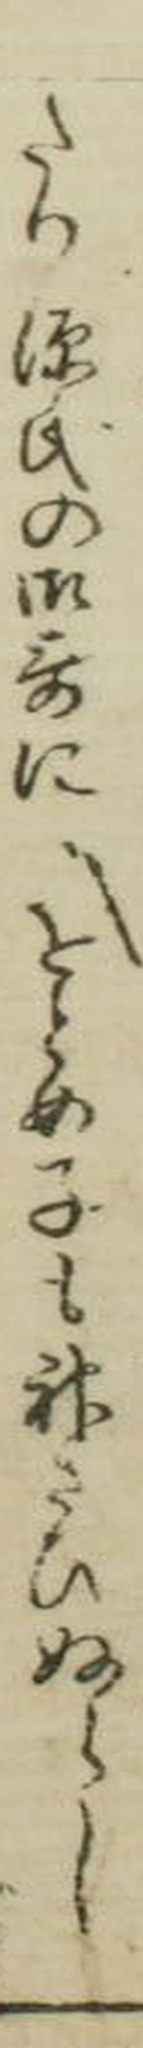たり源氏の御哥に〽をとめ子も神さひぬらし
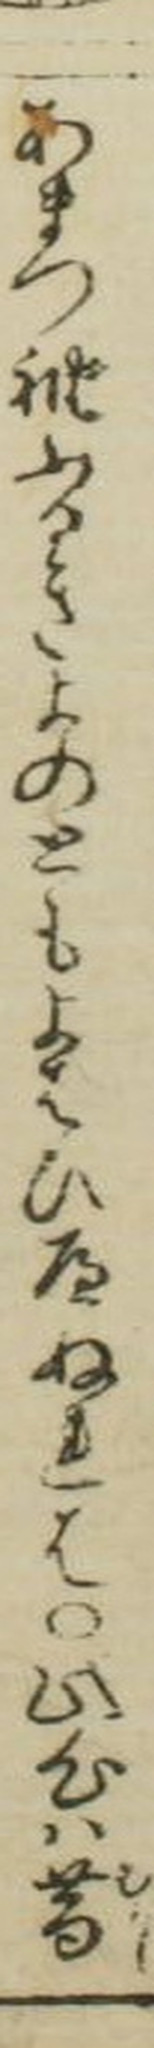あまつ袖ふるきよのともよはひへぬれは○此心は昔
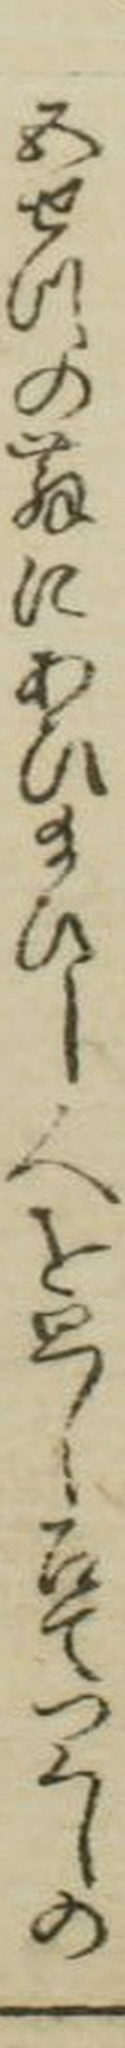五せつの舞にあひ給ひし人を思し召てつくしの
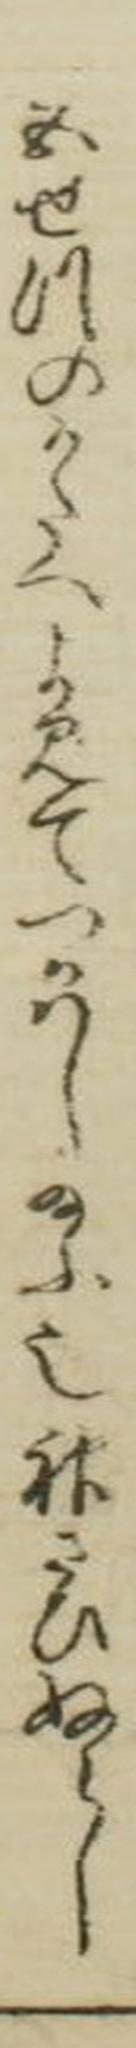五せつのかたへよみてつかはし給ふ也神さひぬらし
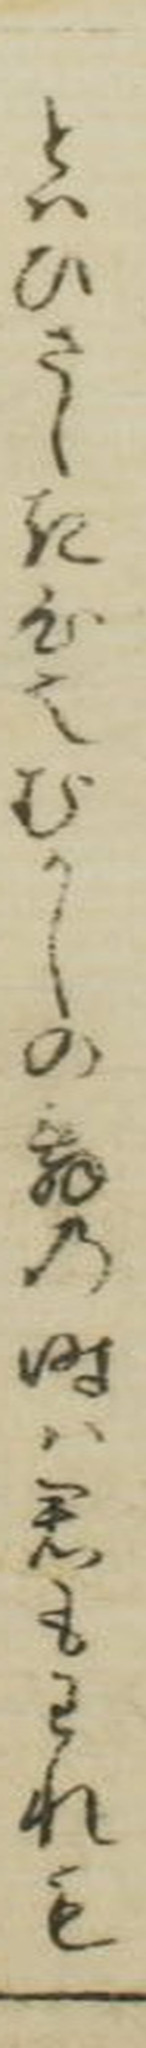とはひさしき心也むかしの舞の時は君もわれも
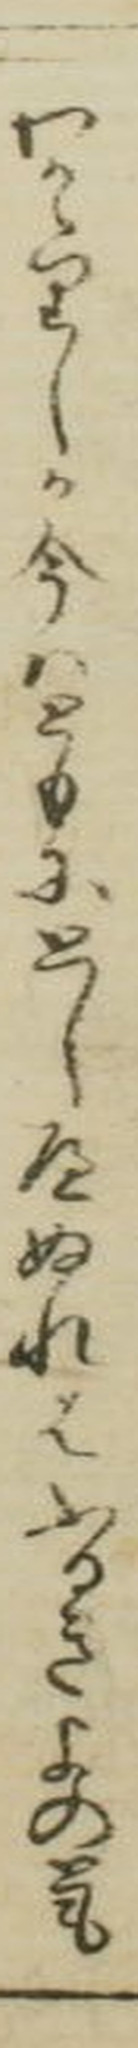わかゝりしか今はともにとしへぬれはふるきよのとも
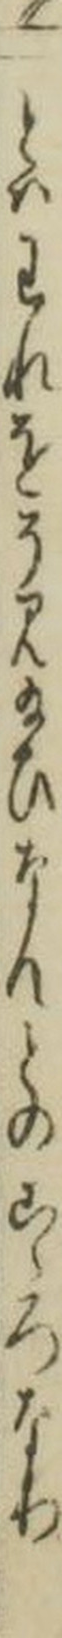とはわれをそみ給なんとのこゝろなり
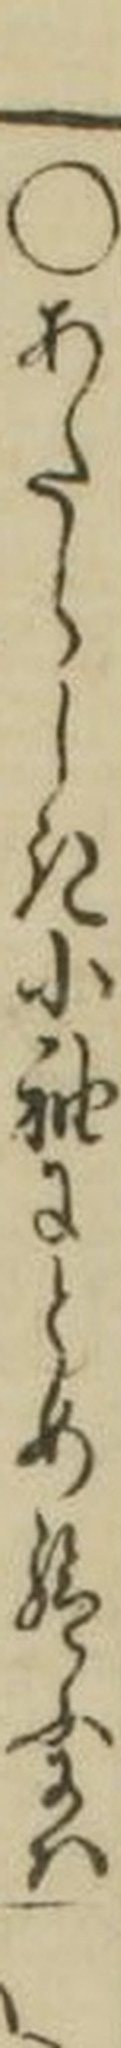○あたらしき小袖にとめ給ふには
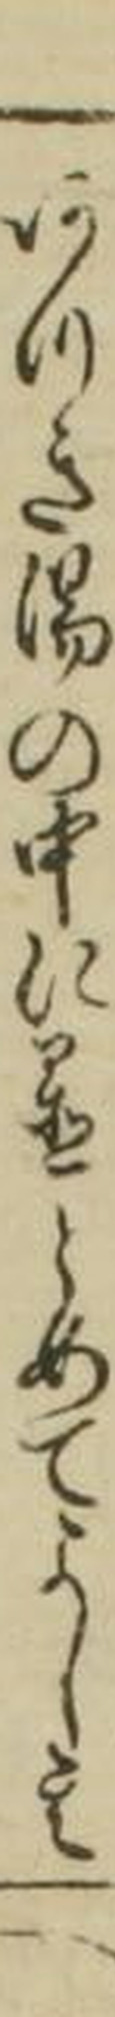あつき湯の中に置とめてよし其
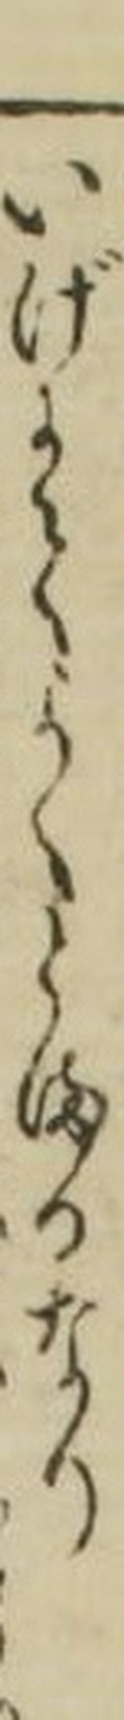いげにてよくとまるなり
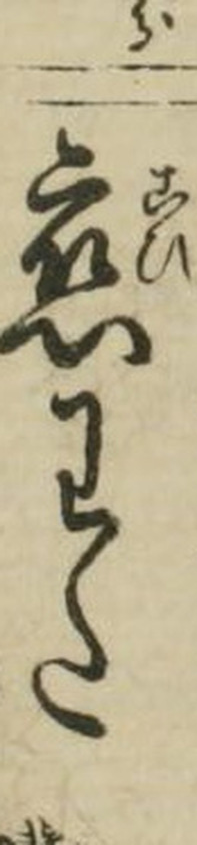恋わた
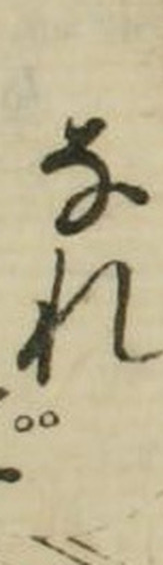なれど
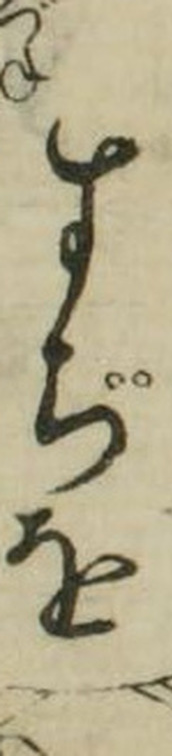すぢを
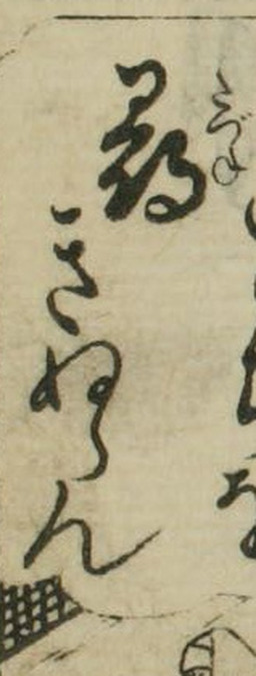きぬらん
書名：女源氏教訓鑑
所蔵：東京学芸大学附属図書館
